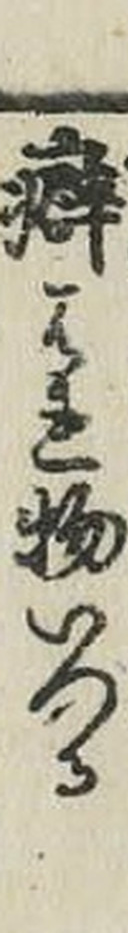癖はれ物いづる
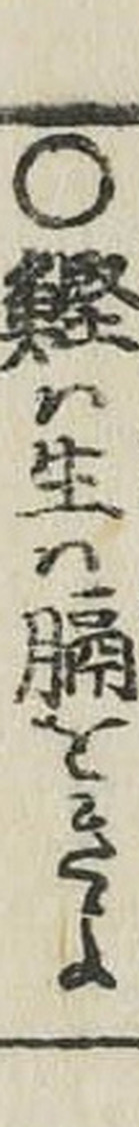○鰹は生は膈をきよ
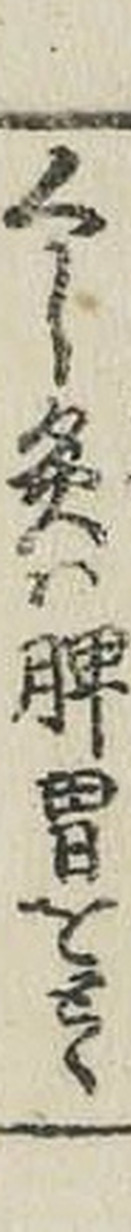くし炙は脾胃をとゝ
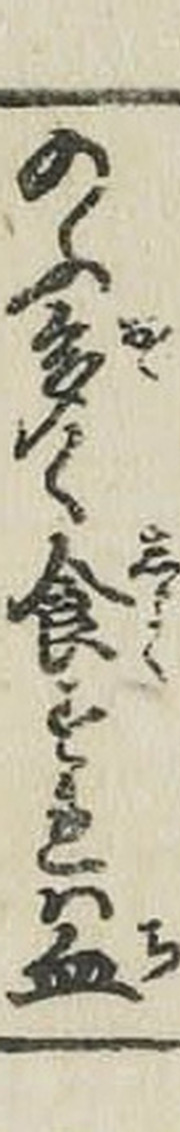のふ多く食すれは血
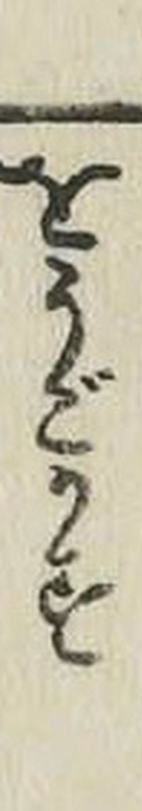をうごかす
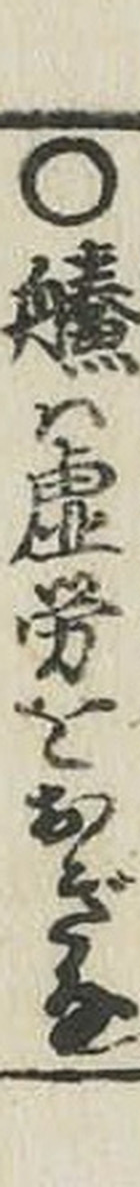○䲍は虚労をおぎな
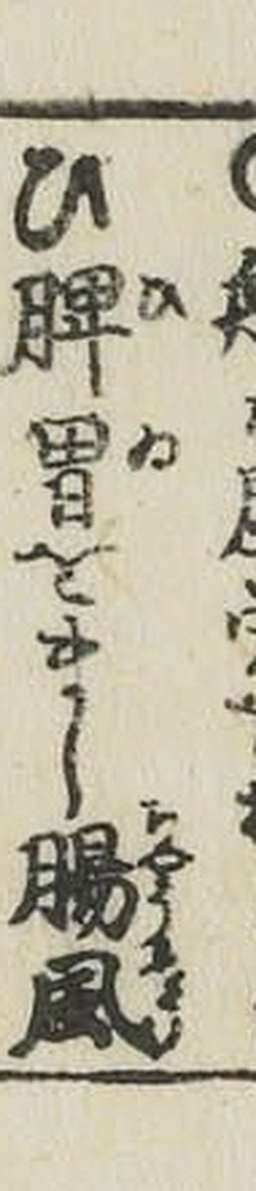ひ脾胃をまし腸風
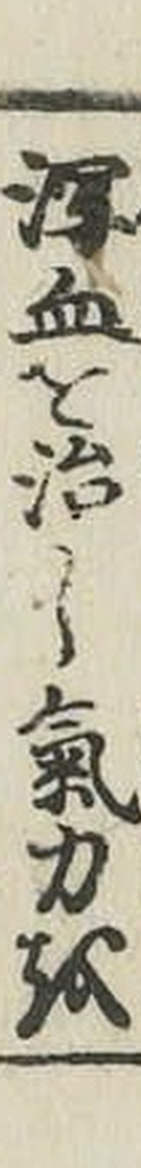瀉血を治し気力を
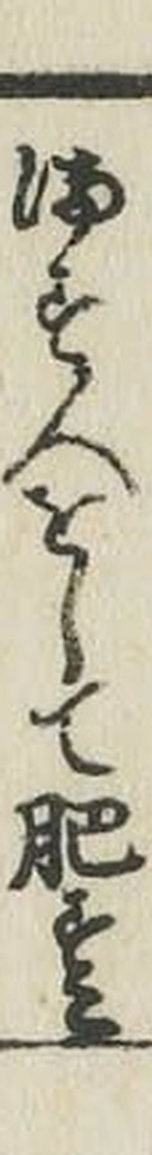ます人をして肥すこ
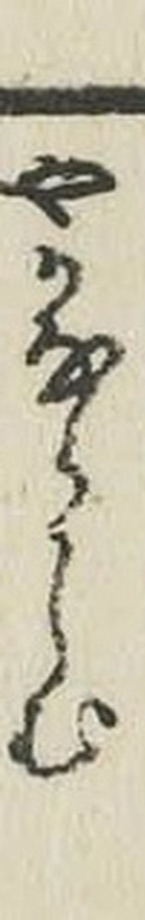やかならしむ
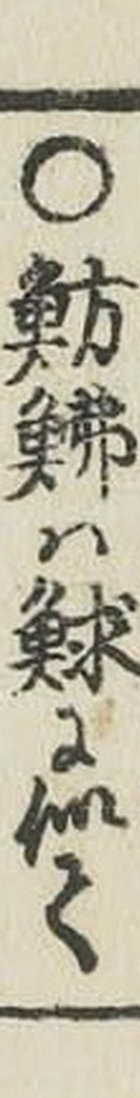○魴鮄は鯄に似て
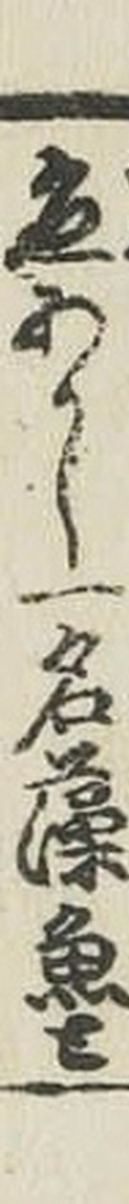色あかし一名藻魚と
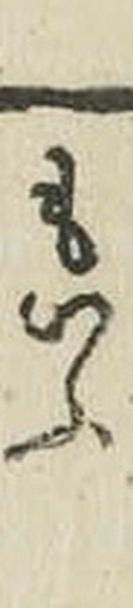もいふ
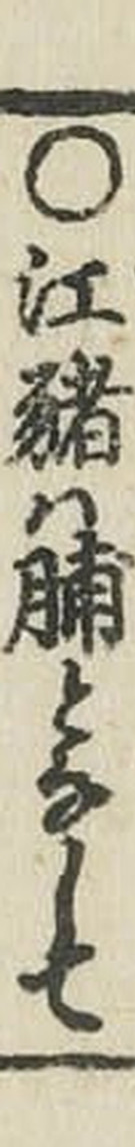○江猪は脯となして
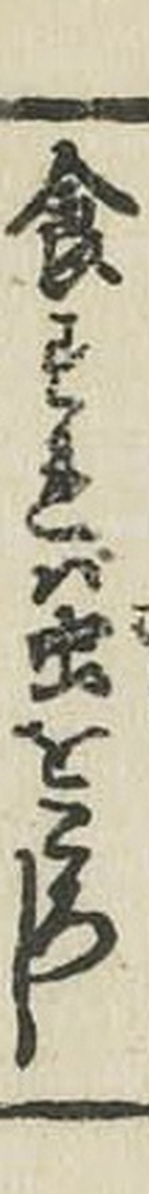食すれば虫をころし
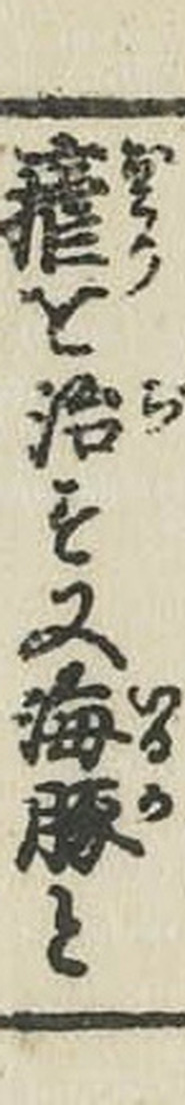瘧を治す又海豚と
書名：増補頭書訓蒙図彙大成 10巻 7:巻之14-16
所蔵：東京学芸大学教育コンテンツアーカイブ
